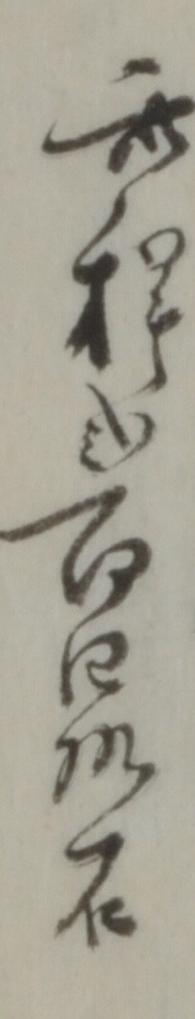此稈弐百四拾石

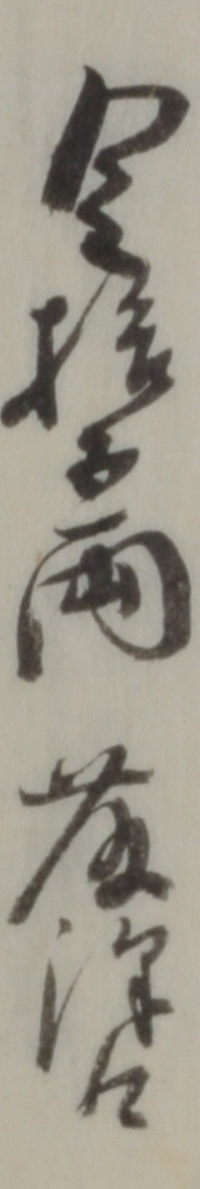一金拾五両藤沢郷
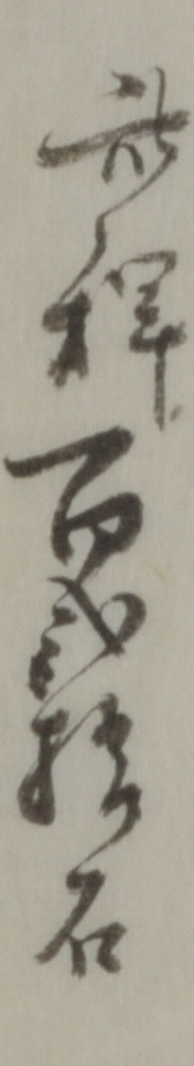此稈百弐拾石
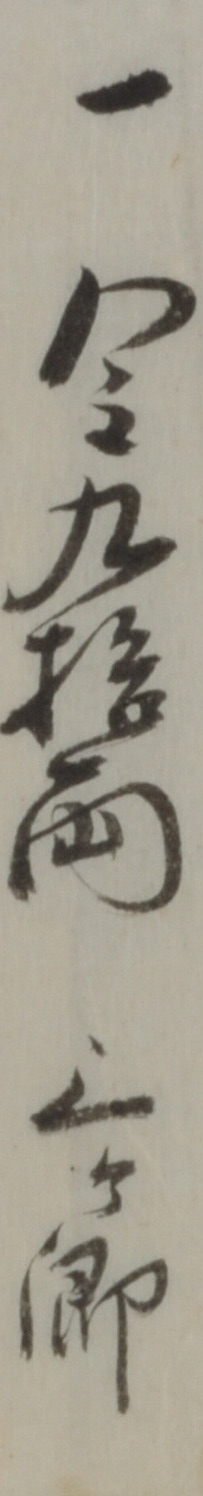一金九拾両三ヶ郷
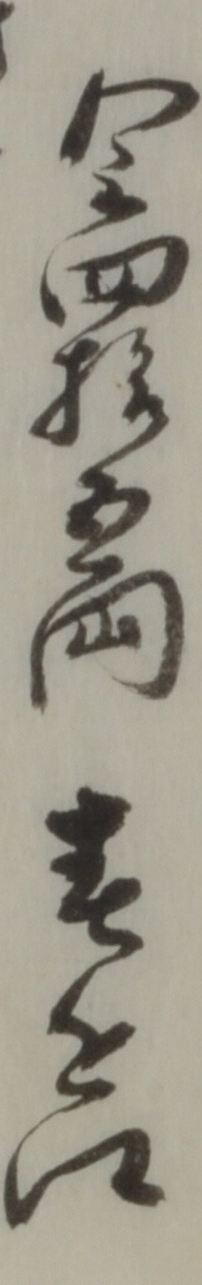金四拾五両春近郷
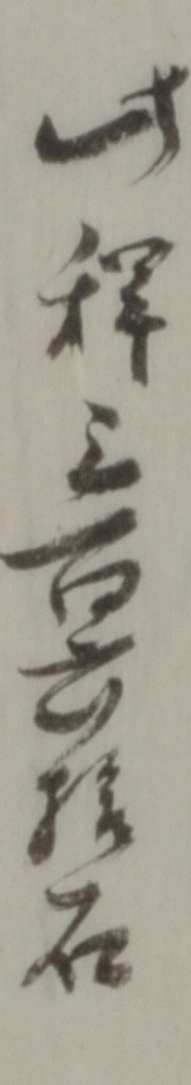此稈三百六拾石
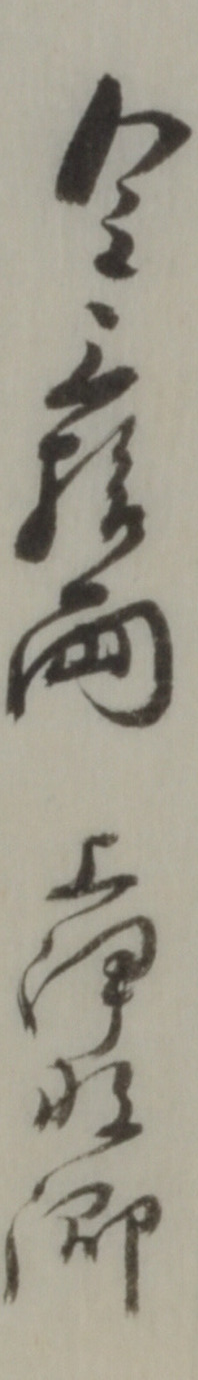金三拾両上伊那郷
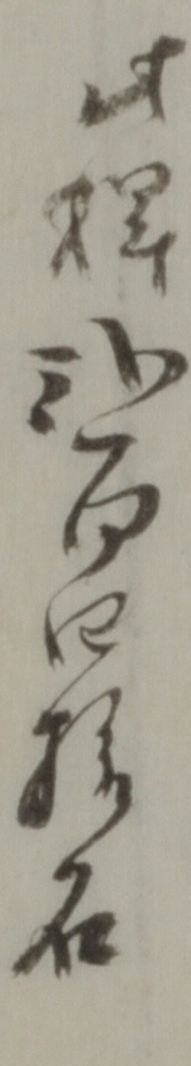此稈弐百四拾石
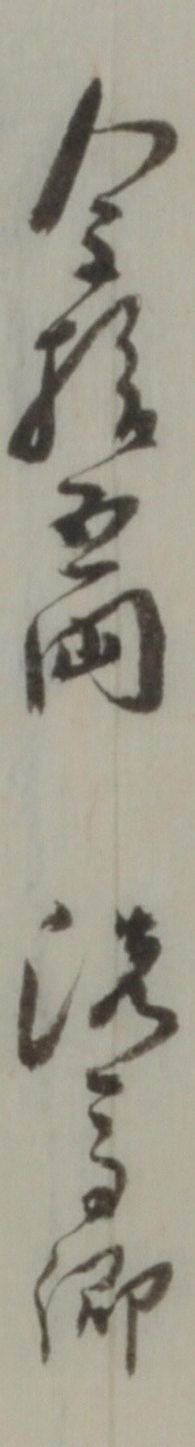金拾五両洗馬郷
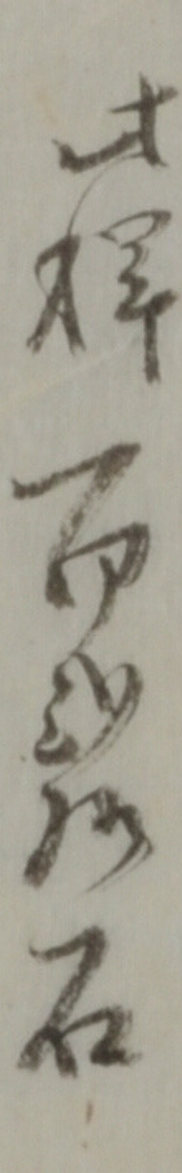此稈百弐拾石
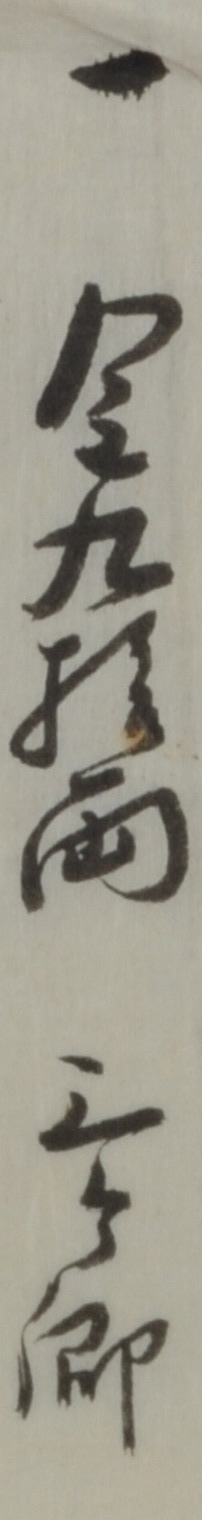一金九拾両三ヶ郷
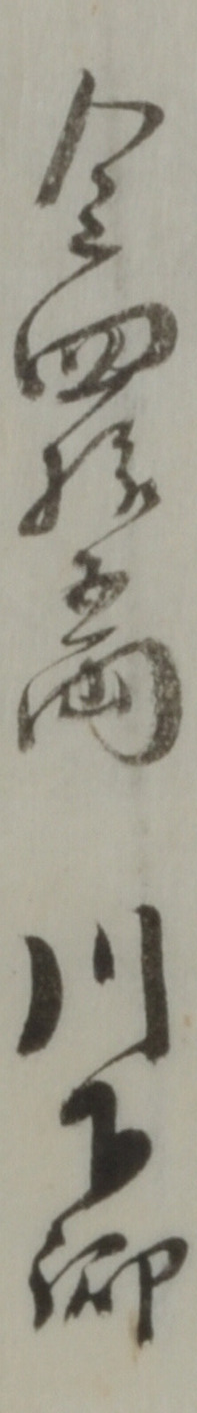金四拾五両川下郷
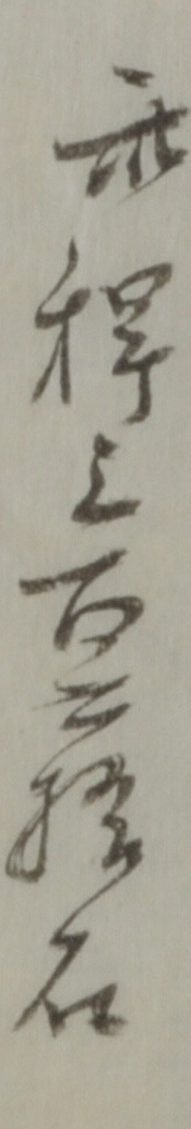此稈三百六拾石
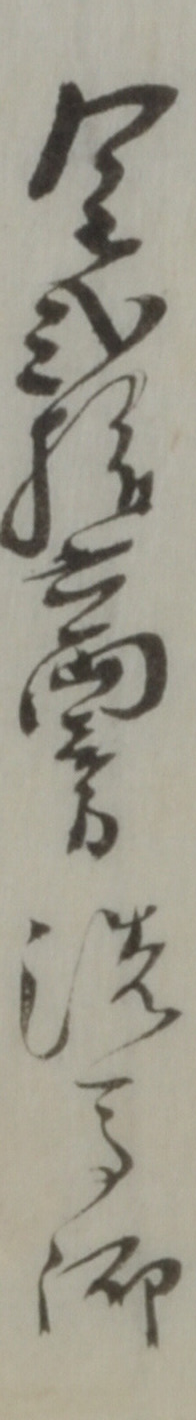金弐拾六両壱分洗馬郷
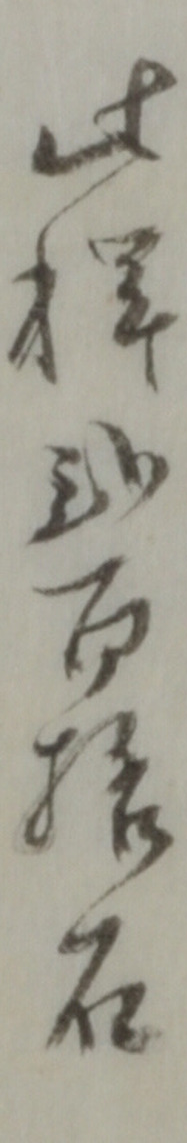此稈弐百拾石
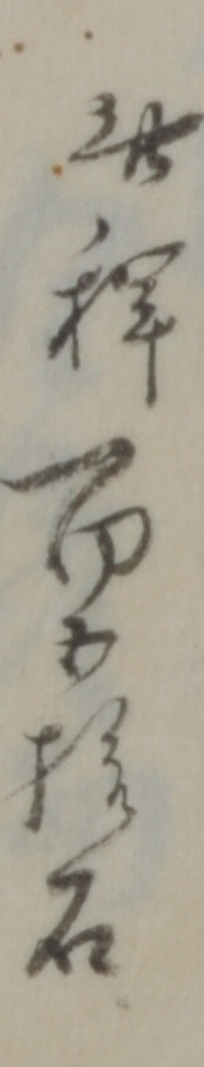此稈百弐拾石
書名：在町雑穀御買入大図
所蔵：伊那市立高遠町図書館・合同会社AMANE
